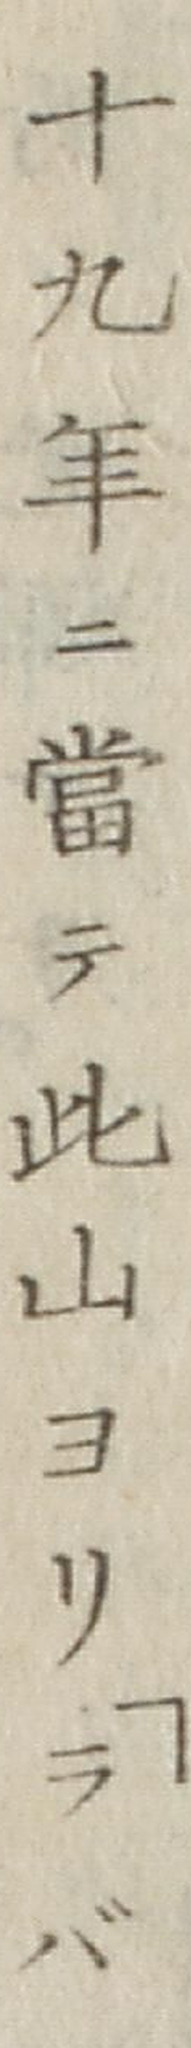十九年ニ当テ此山ヨリ「ラバ
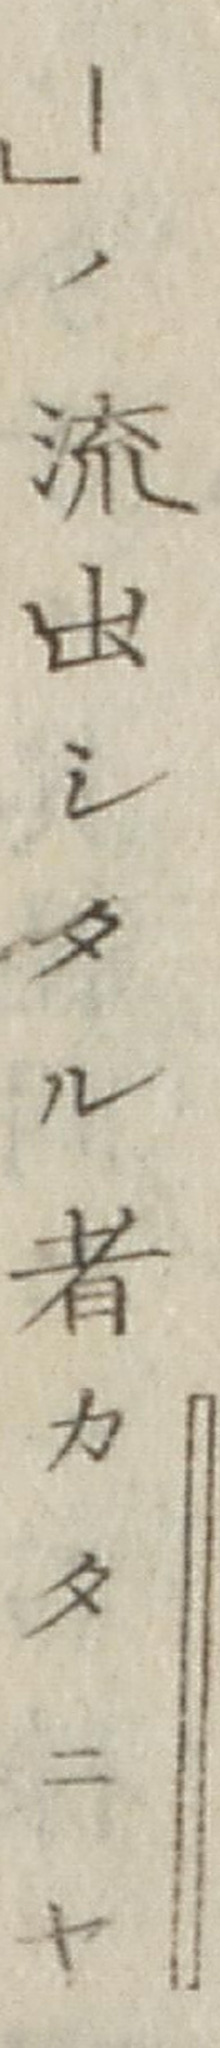ー」ノ流出シタル者カタニヤ
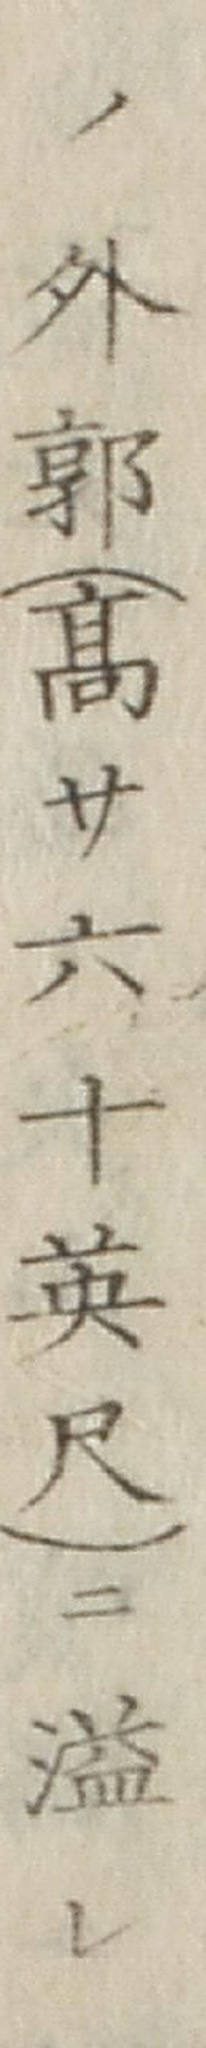ノ外部ニ溢レ
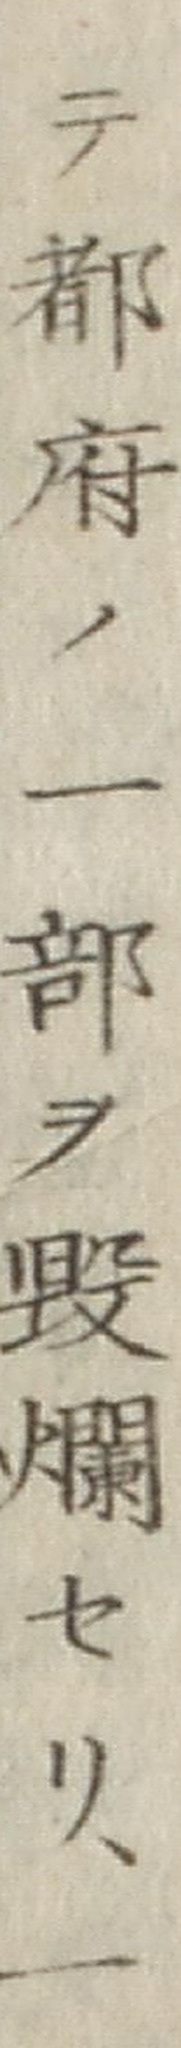テ都府ノ一部ヲ毀爛セリ、一
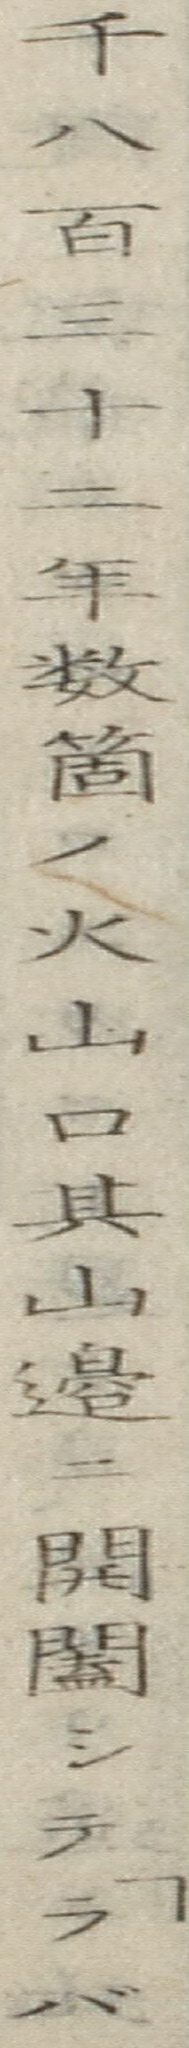千八百三十二年数箇ノ火山口其山辺ニ開閉シテ「ラバ
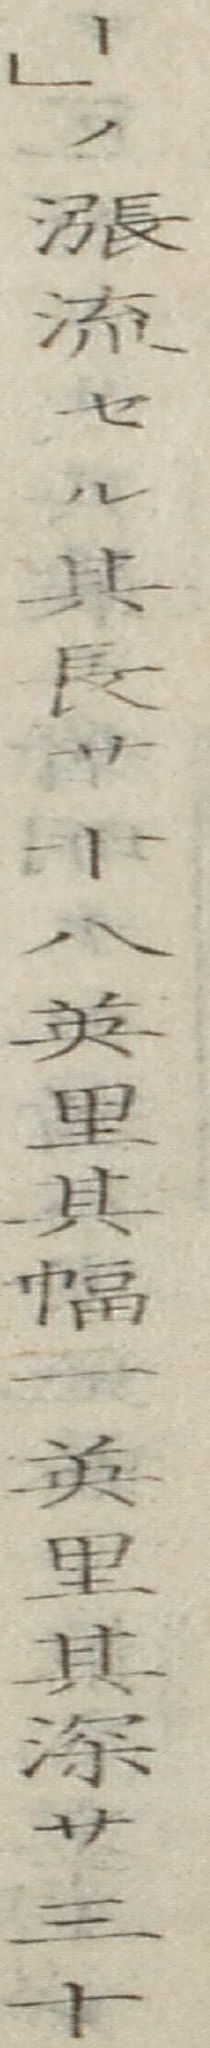ー」ノ漲流セル其長サ十八英里其幅一英里其深サ三十
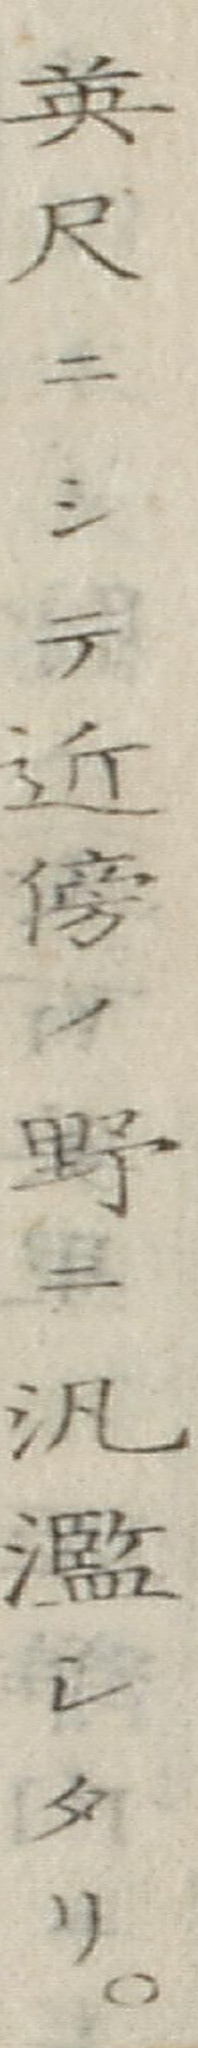英尺ニシテ近傍ノ野ニ汎濫シタリ。
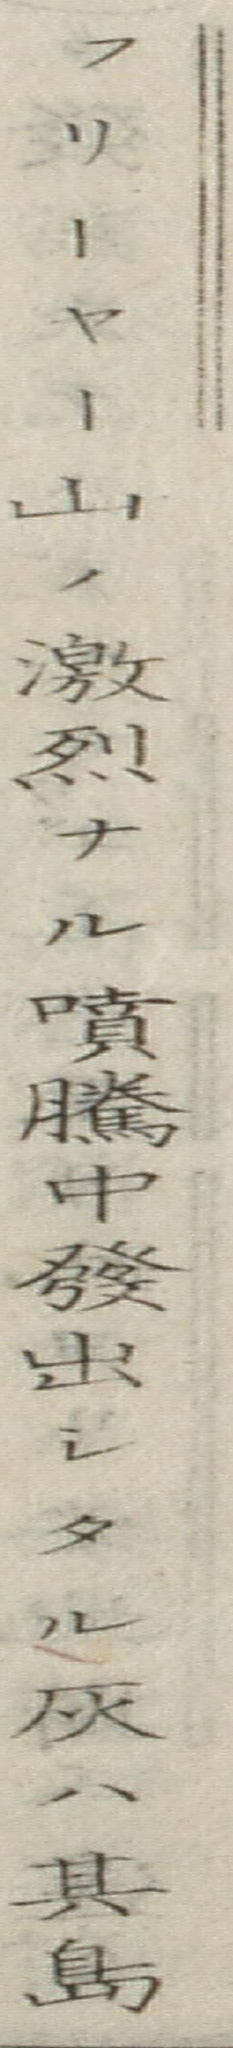フリーヤー山ノ激烈ナル噴騰中発出シタル灰ハ其島
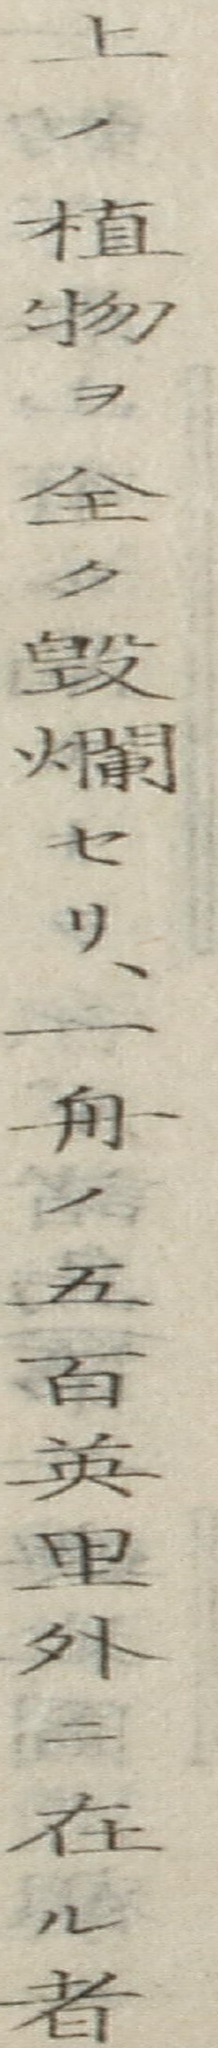上ノ植物ヲ全ク毀爛セリ、人舟ノ五百英里外ニ在ル者
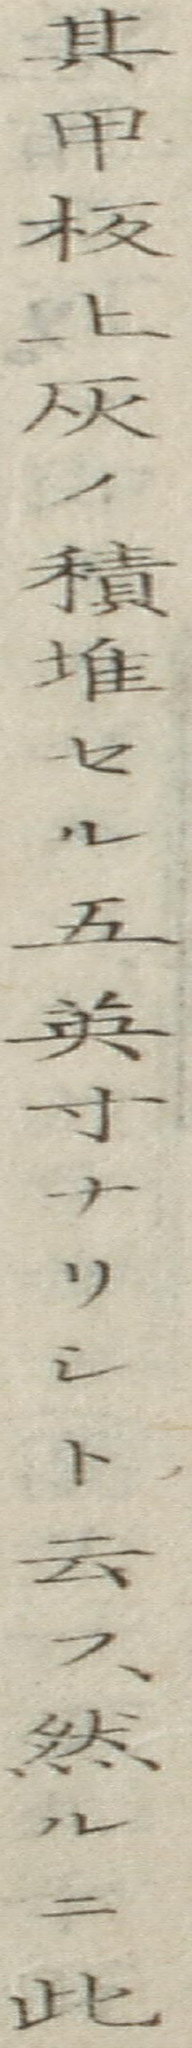其甲板上灰ノ積堆セル五英寸ナリシト云フ、然ルニ此
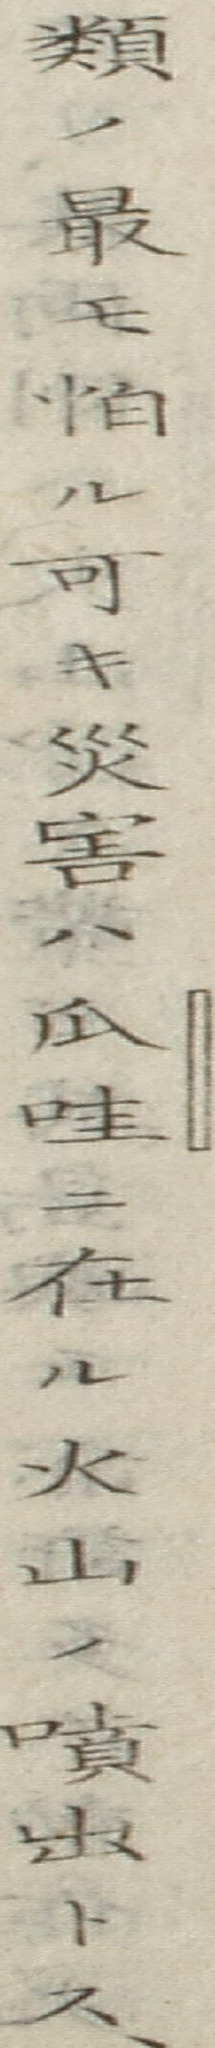類ノ最モ怕ル可キ災害ハ瓜哇ニ在ル火山ノ噴出トス、
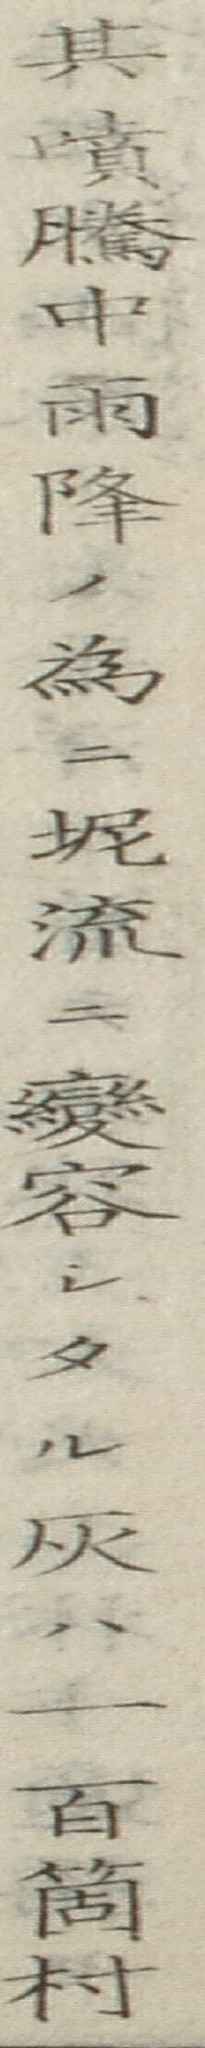其噴騰中雨降ノ為ニ泥流ニ変容シタル灰ハ一百箇村
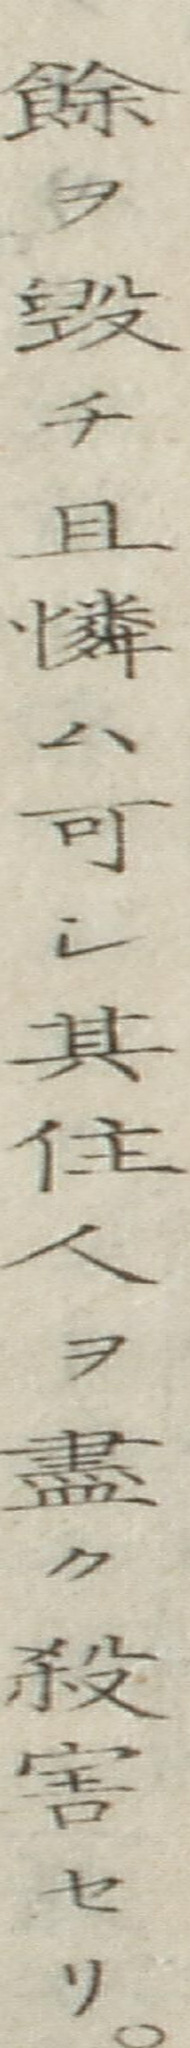餘ヲ毀チ且憐ム可シ其住人ヲ盡ク殺害セリ。
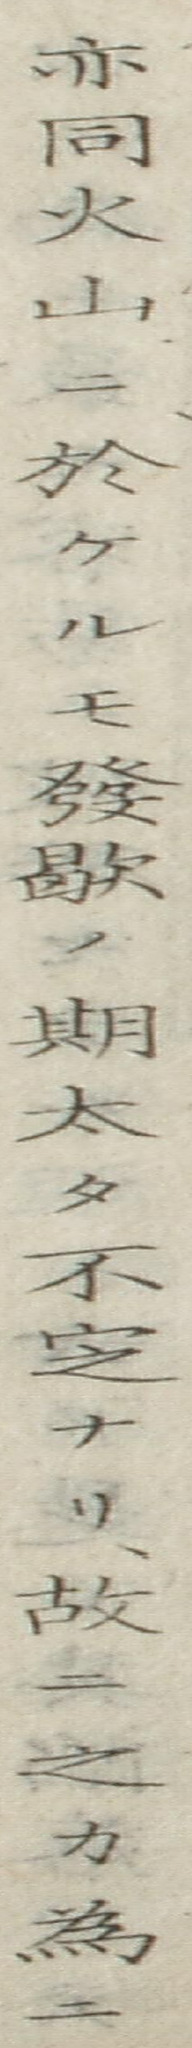亦同火山ニ於ケルモ発歇ノ期太タ不定ナリ、故ニ之カ為ニ
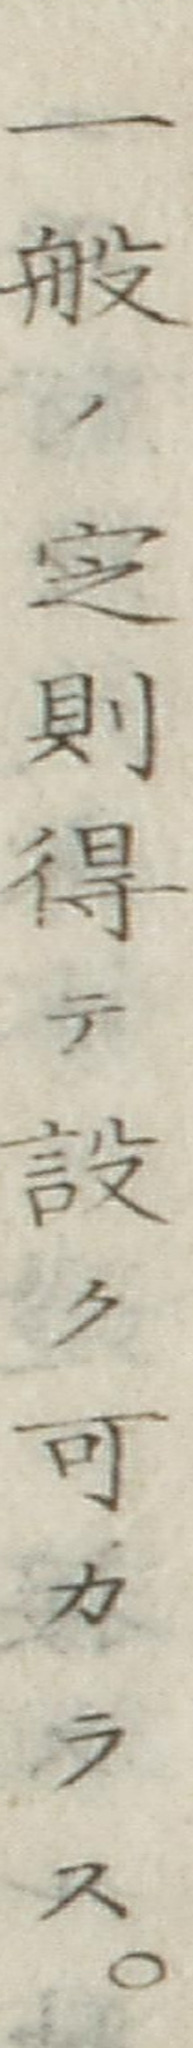一般ノ定則得テ設ク可カラス。
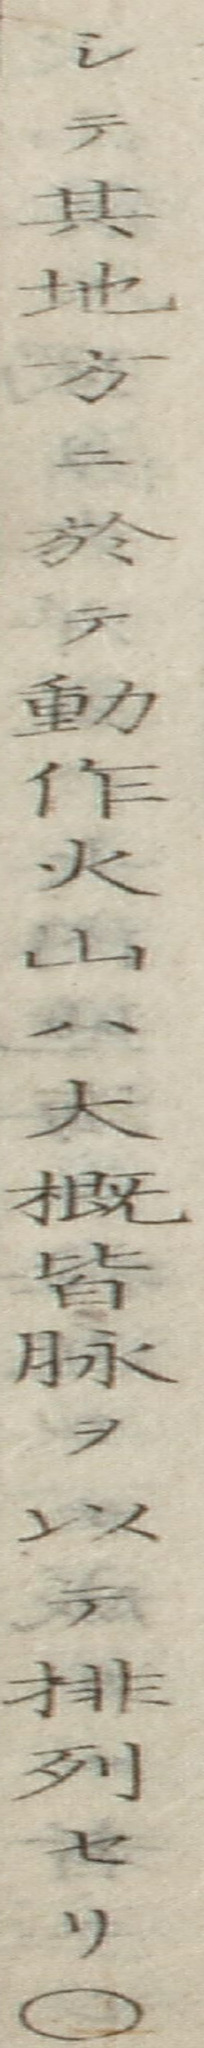シテ其地方ニ於テ動作火山ハ大概皆脈ヲ以テ排列セリ〇
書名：地形論　巻二
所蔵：東京大学地震研究所図書室 Earthquake Research Institute Library, The University of Tokyo, JAPAN
